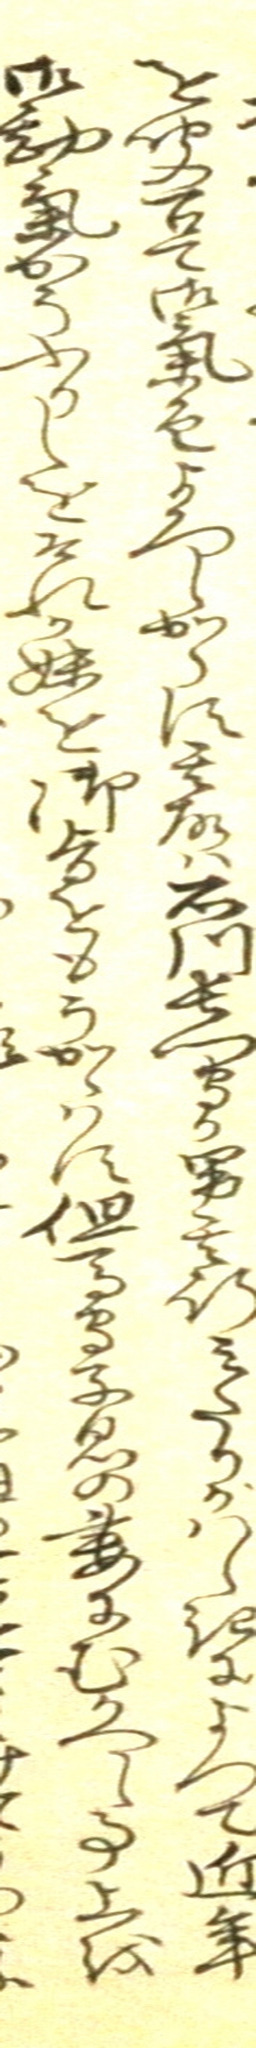御勘気かうふりしをそれか妹を御旨をもうかゝはす但馬守子息の妻にむかへし事上を
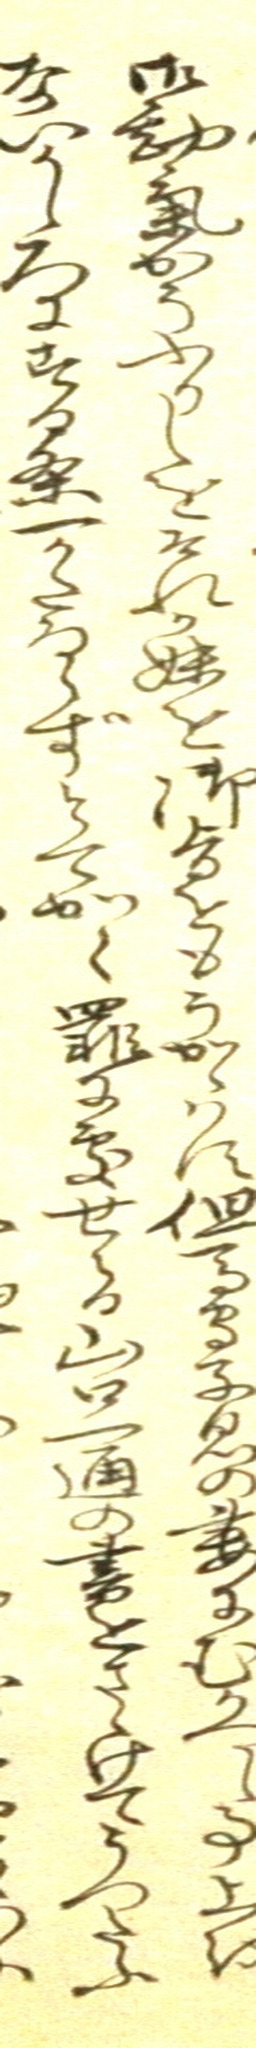ないかしろにする条一かたならずとてかく罪に処せらる山口一通の書をさゝけてうつたふ
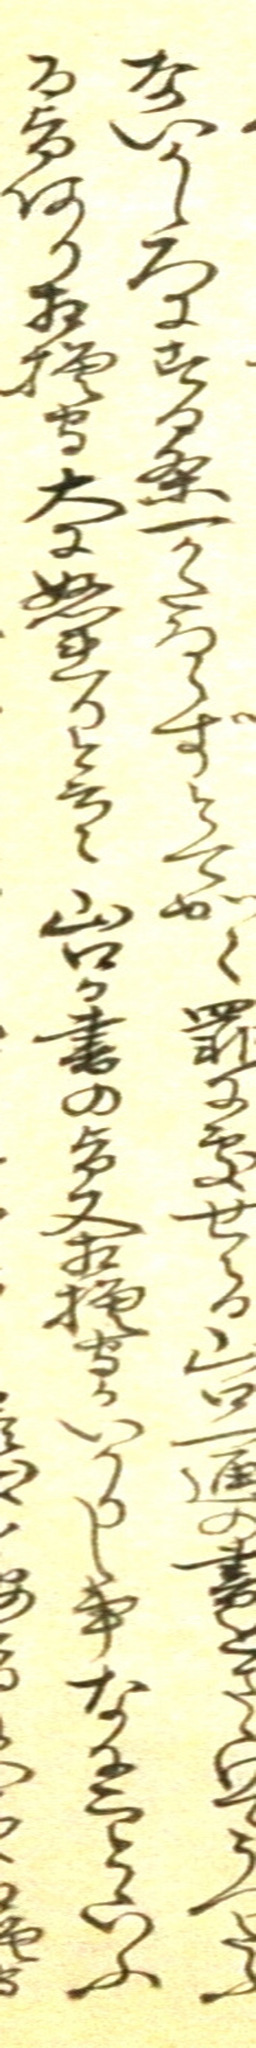る旨あり相模守大に怒れりと云々山口か書の旨又相模守かいかりし事なにことゝいふ
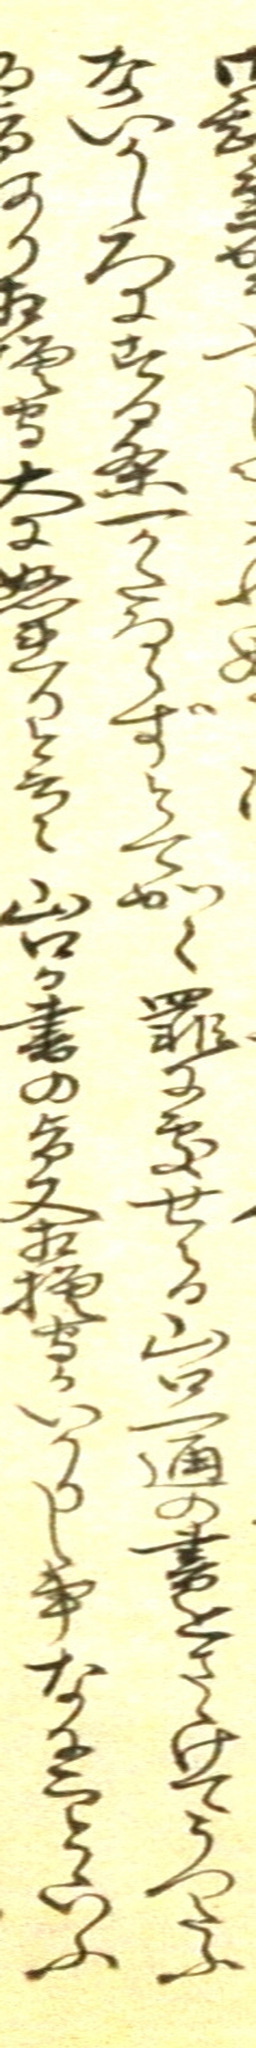る旨あり相模守大に怒れりと云々山口か書の旨又相模守かいかりし事なにことゝいふ
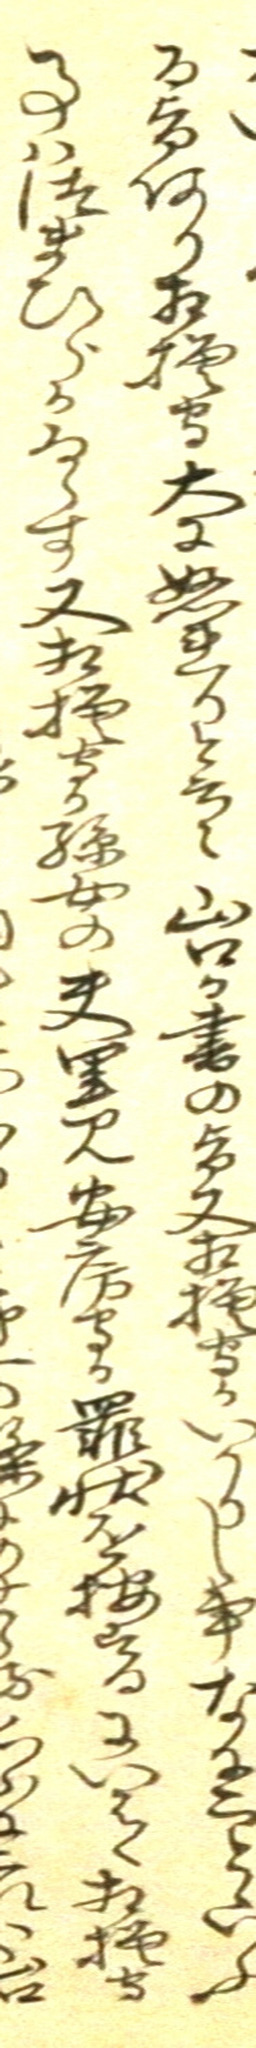事はつまひらかならす又相模守か孫女の夫里見安房か罪状を按するにいはく相模守
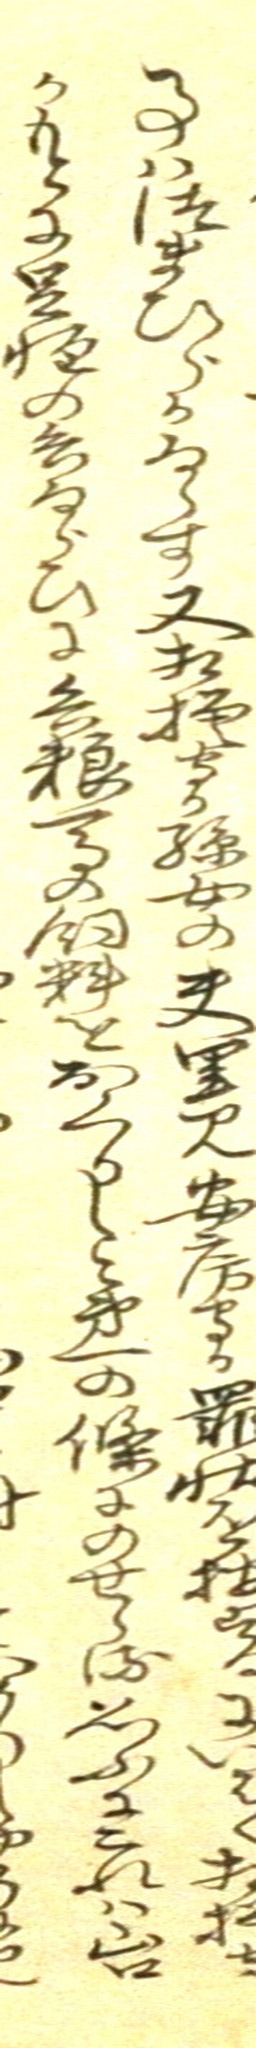かもとに足軽の兵ならひに兵糧馬の飼料をおくりしと第一の条にのせらる思ふにこれは山口
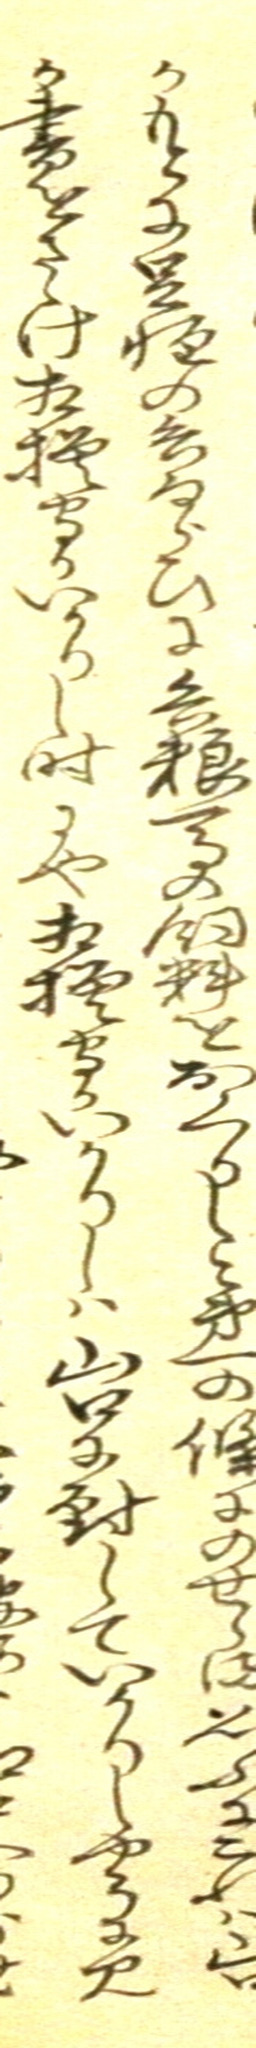か書をさゝけ相模守かいかりし時にや相模守かいかりしは山口に対していかりしやうに見
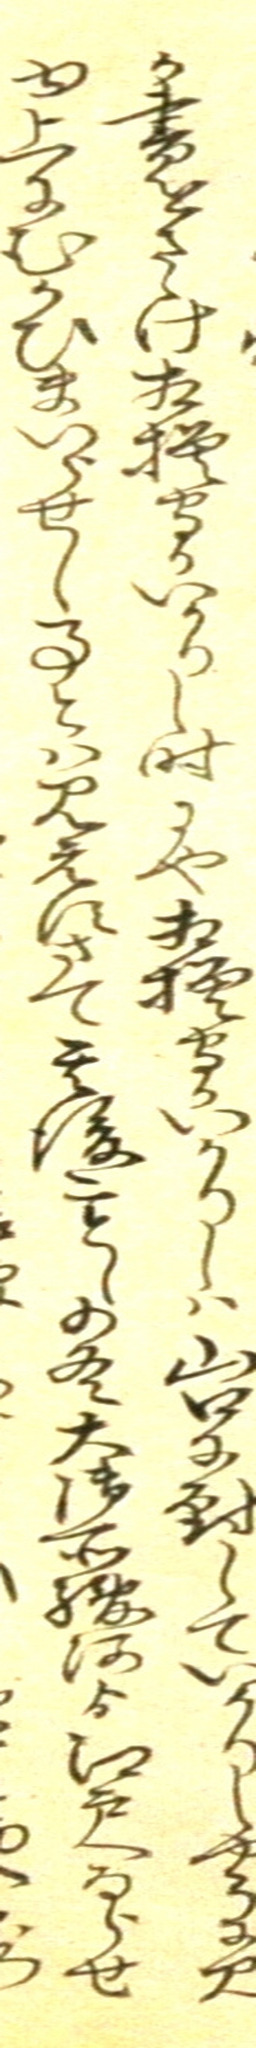ゆ上にむかひまいらせし事とは見えすさて其後ことしの冬大御所駿河ゟ江戸へならせ
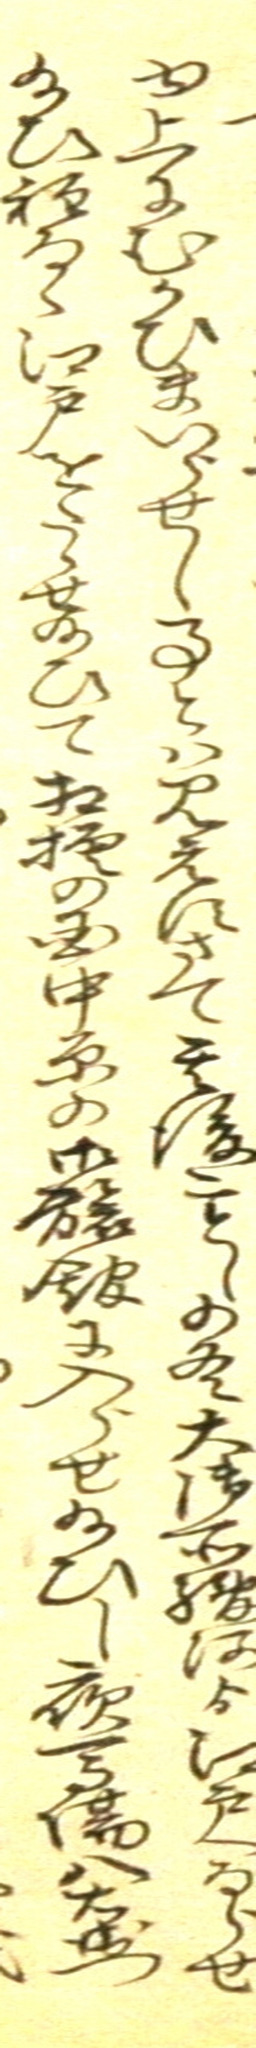給ひ程なく江戸をたゝせ給ひて相模の国中原の御旅舘に入らせ給ひし夜馬場八右衛門
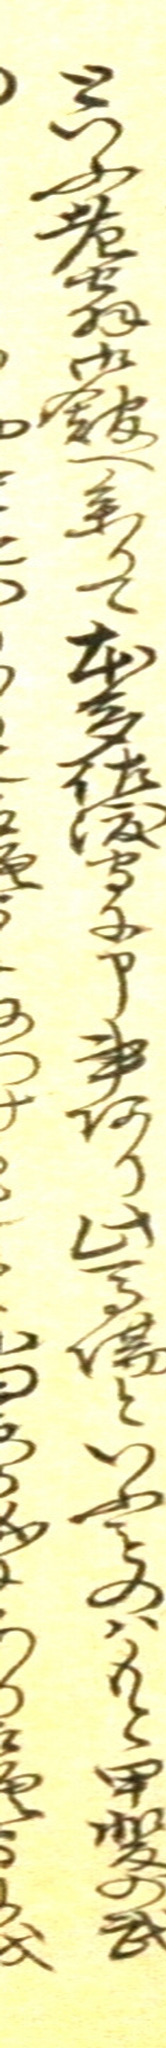といふ老翁御舘へ参りて本多佐渡守に申事あり此馬場といふものはもと甲斐の武
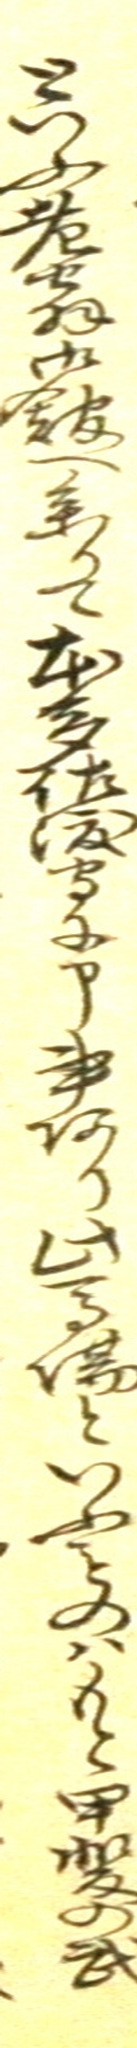といふ老翁御舘へ参りて本多佐渡守に申事あり此馬場といふものはもと甲斐の武
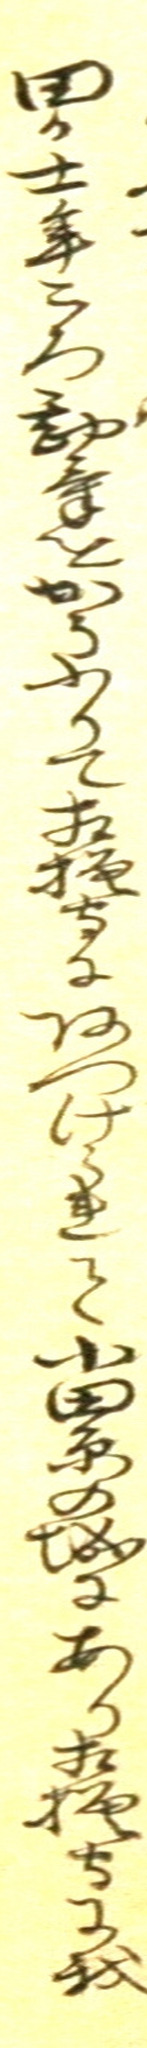田か士年ころ勘気をかうふりて相模守にあつけられて小田原の城にあり相模守に我

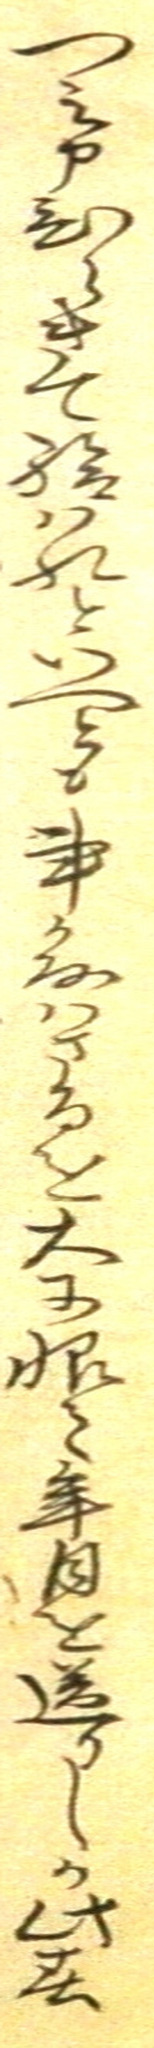つみ申ひらきて給はれといへとも事かなはさるを大に恨て年月を送りしか此春
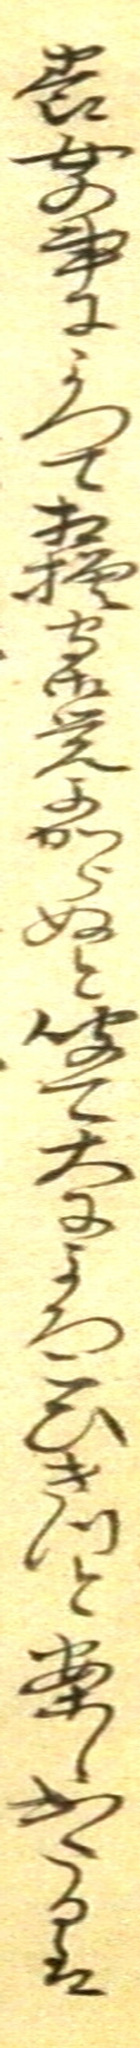養女の事によつて相模守御覚よからぬと聞て大によろこひきつと案し出たるは
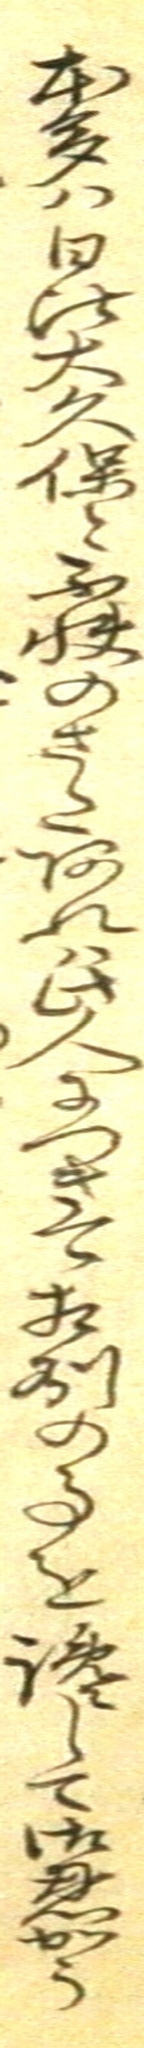本多は日比大久保と不快のさたあれは此人につきて相州の事を讒して御恩かう
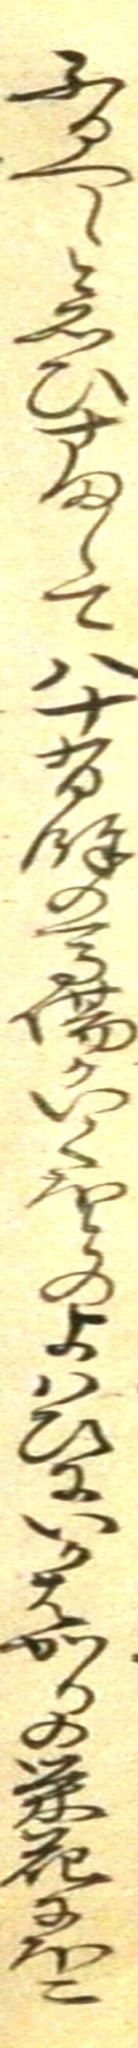ふるへしと思ひすまして八十有余の馬場かいくほとのよはひにいかはかりの栄花にほこ
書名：藩翰譜（四・中）
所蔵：伊那市立高遠町図書館・合同会社AMANE
